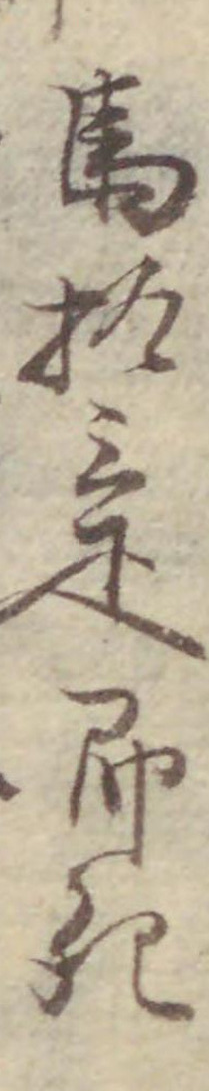一馬拾三疋即死
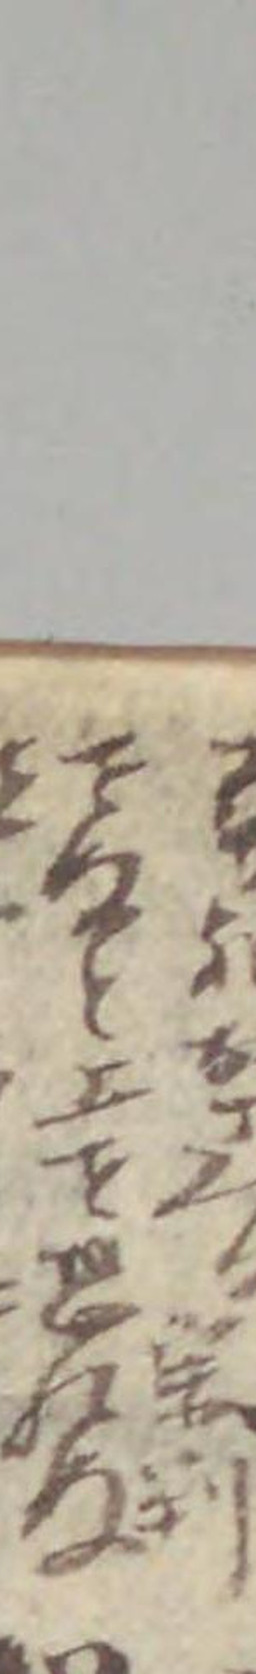せぬと上を恐れぬ
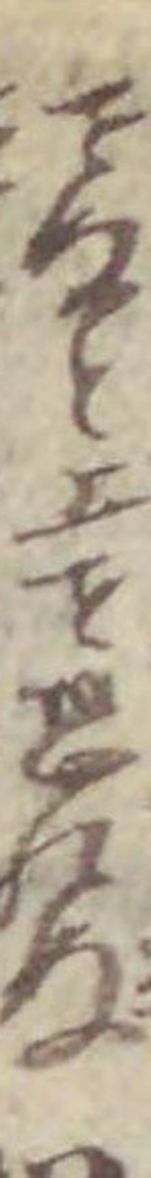せぬと上を恐れぬ
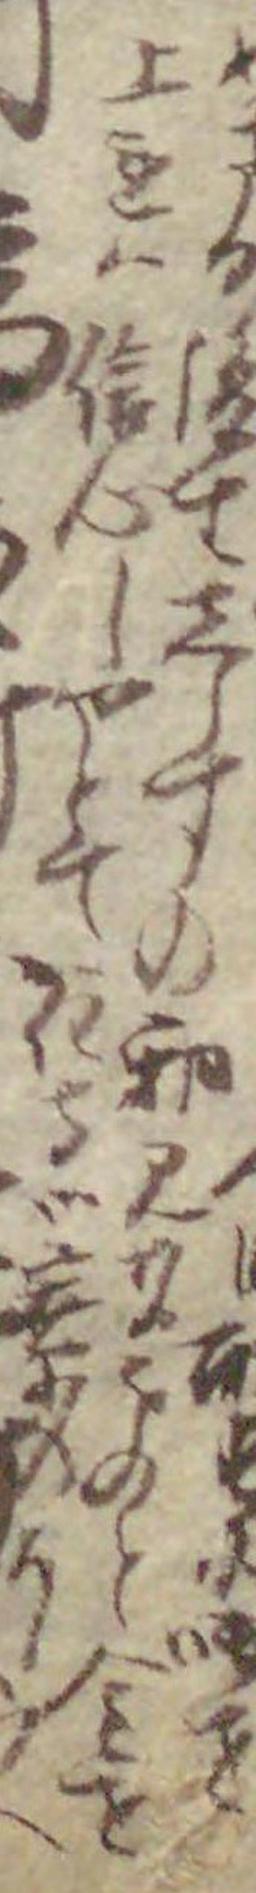上れは信心しやとて住寺御寮のあしらへ
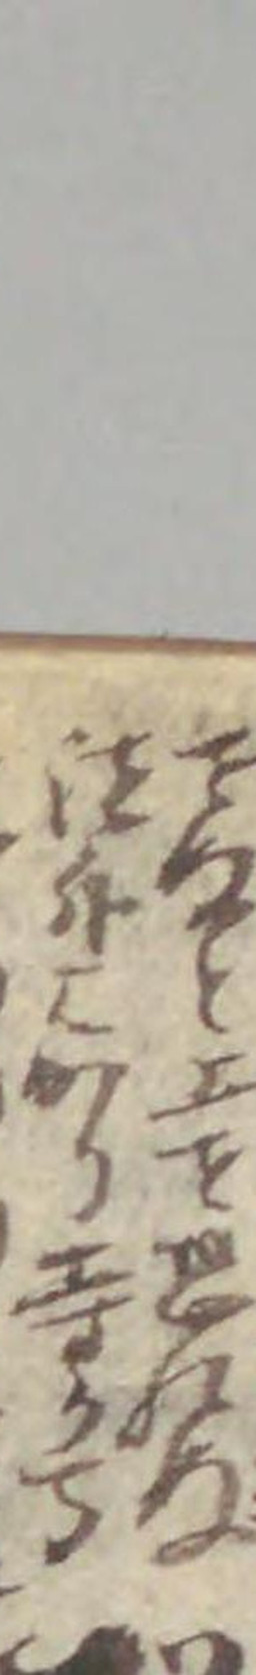法外はかり寺か寺
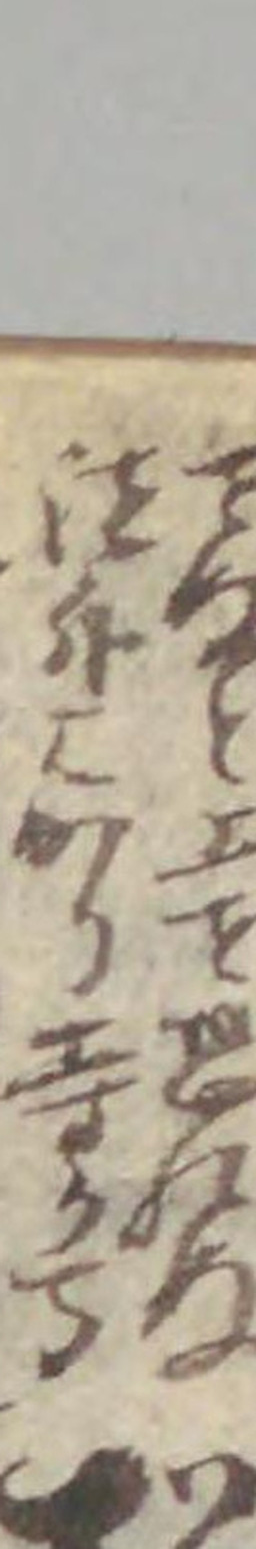法外はかり寺か寺
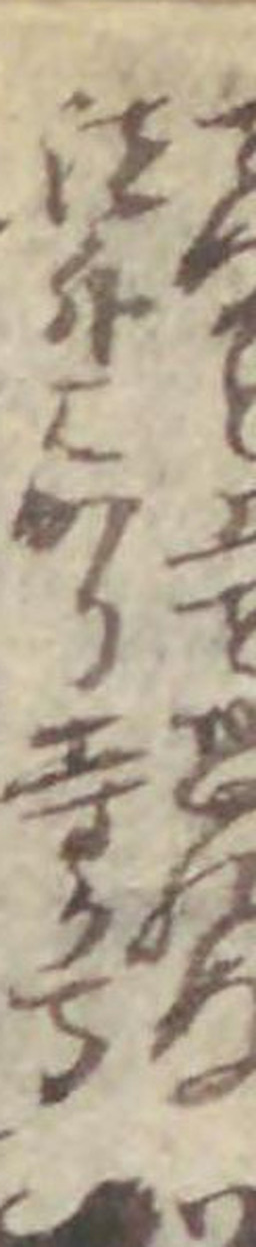法外はかり寺か寺
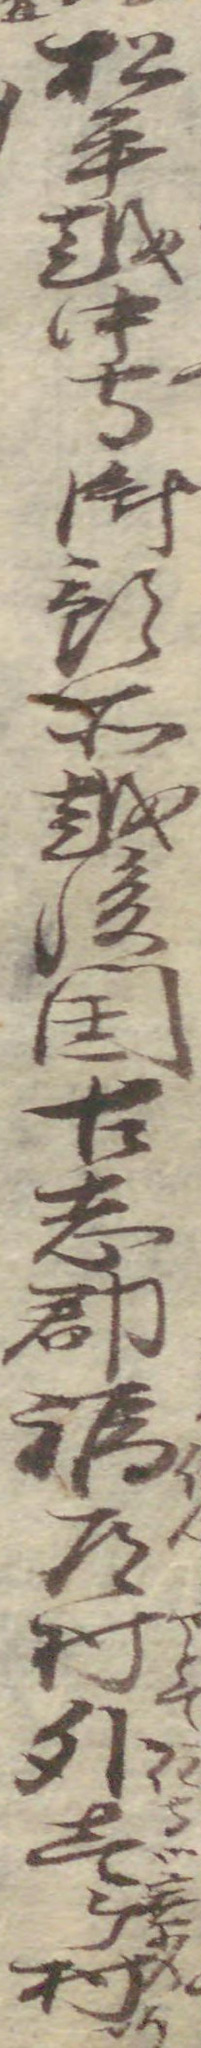松平越中守御預所越後国古志郡福道村外壱ケ村
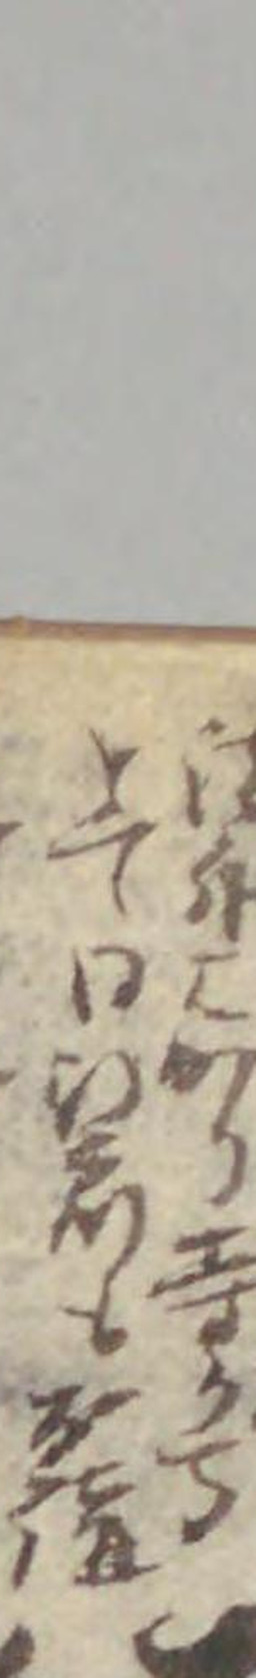とて同行衆もお講
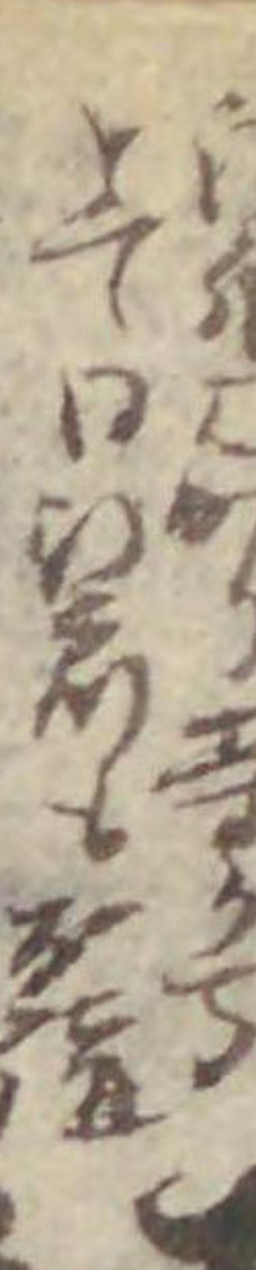とて同行衆もお講
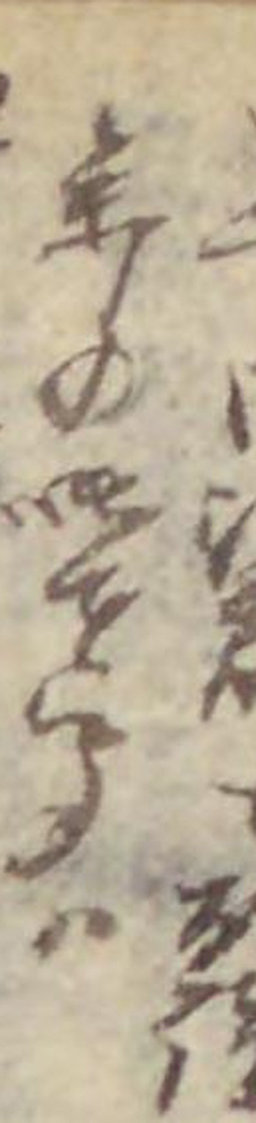参の咄を聞ハ
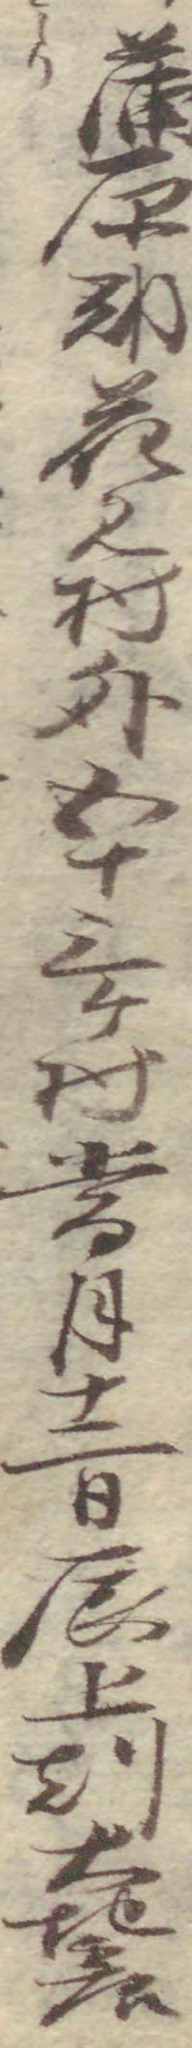蒲原郡花見村外五十三ケ村当月十二日辰上刻大地震
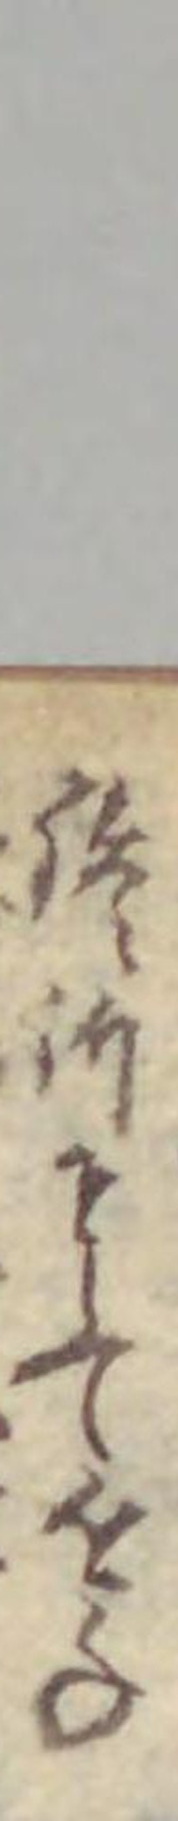讒訴そして近年
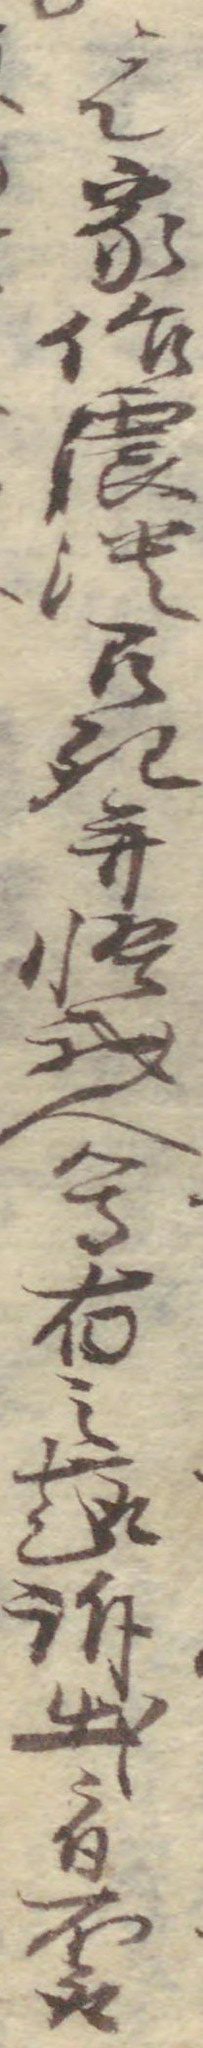ニて家作震潰即死幷怪我人等有之趣訴出候ニ付不取
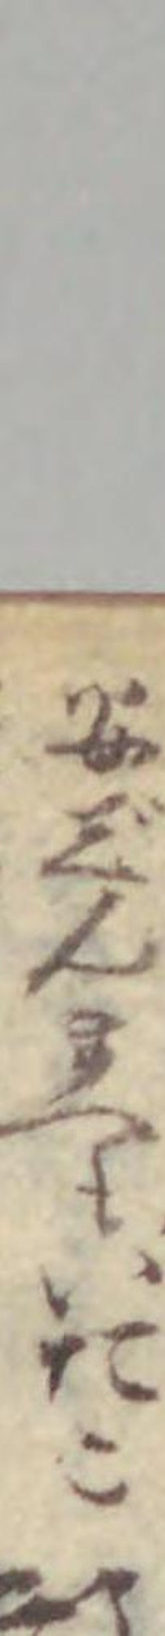安じんまへもいたこ
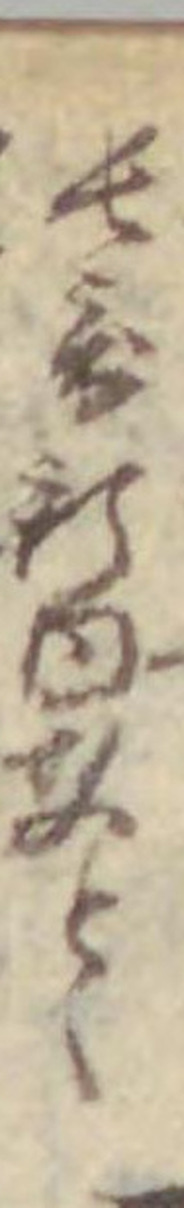長哥新内なとゝ
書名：鶯宿雑記. 巻199-200
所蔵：国立国会図書館 National Diet Library, JAPAN
